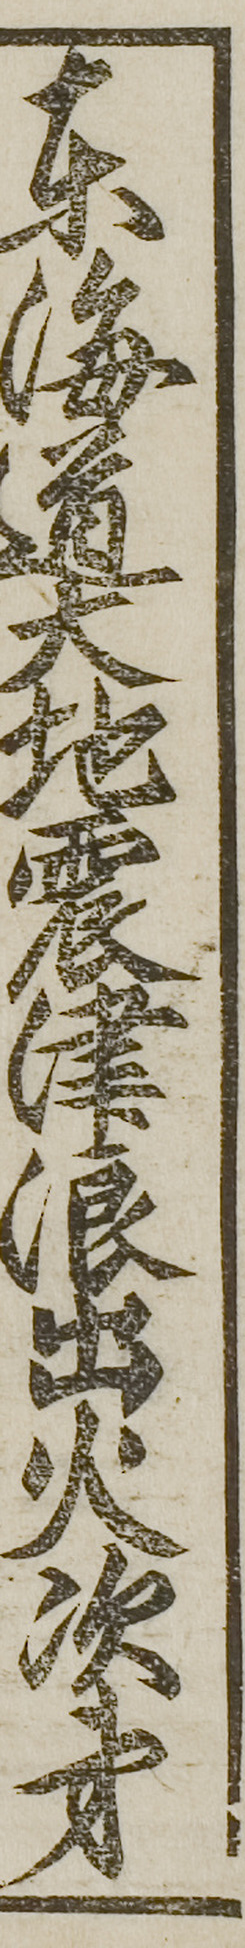東海道大地震津浪出火次第
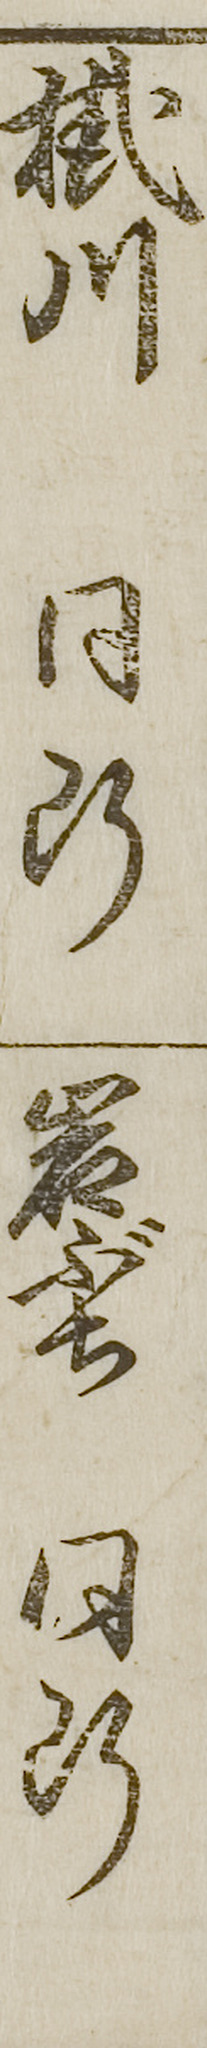掛川同断岩ぶち同断
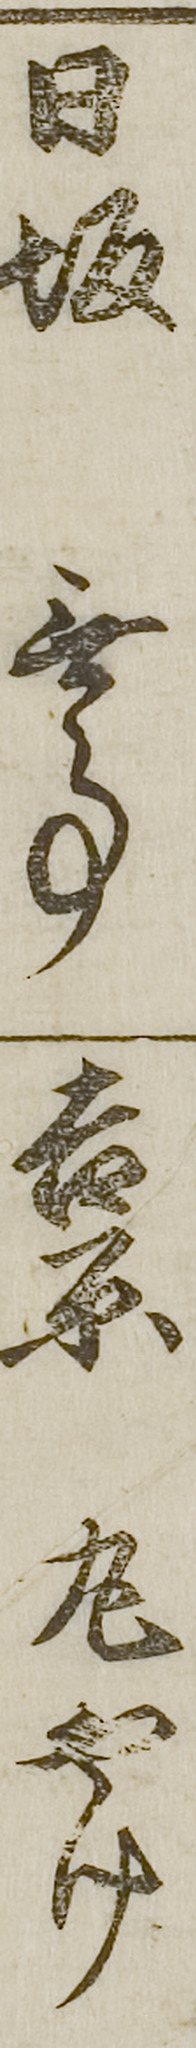日坂無事吉原丸やけ
